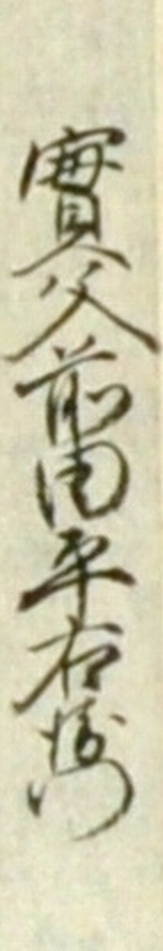實父前田平右衛門
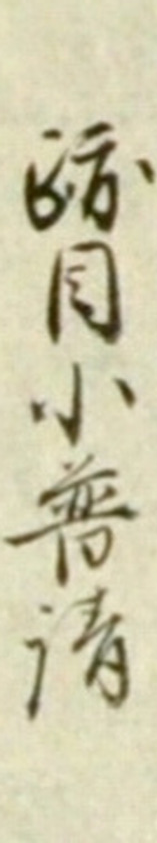跡目小普請
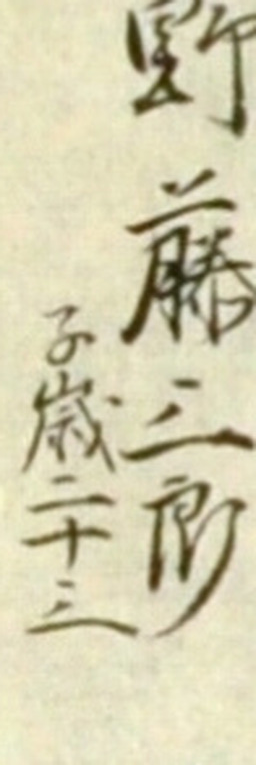子歳二十三
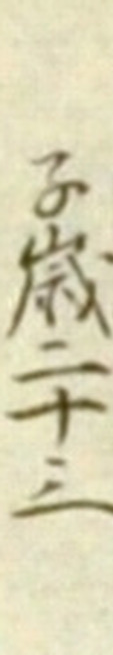子歳二十三
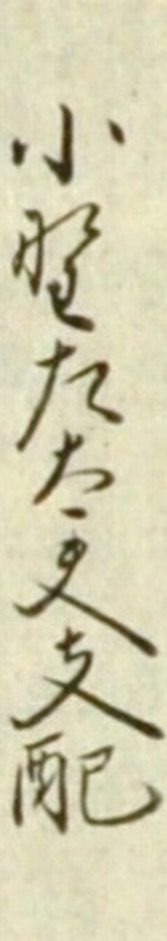小野左太夫支配
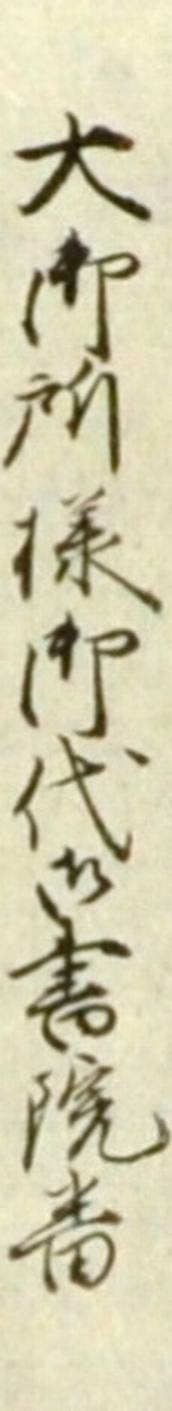大御所様御代御書院番
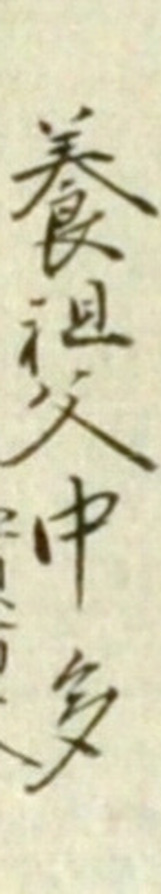養祖父中多
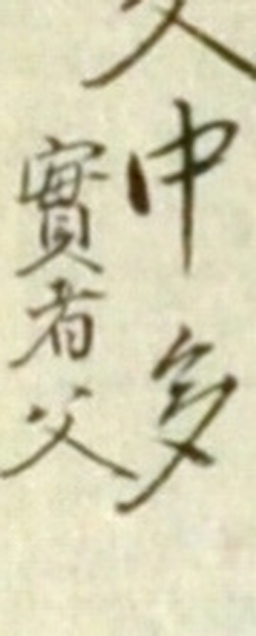實者父
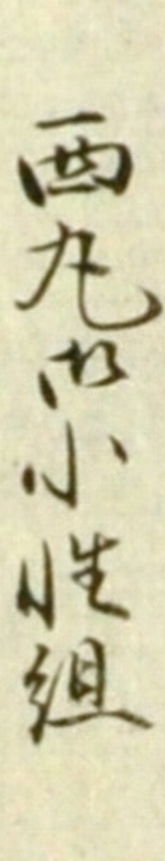西丸御小姓組
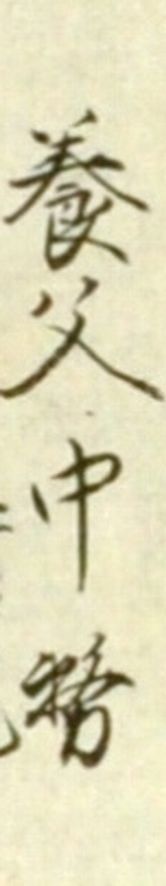養父中務
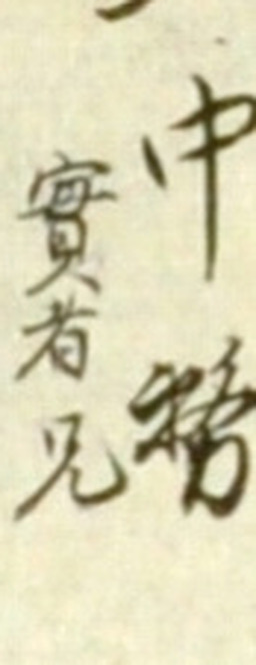實者兄
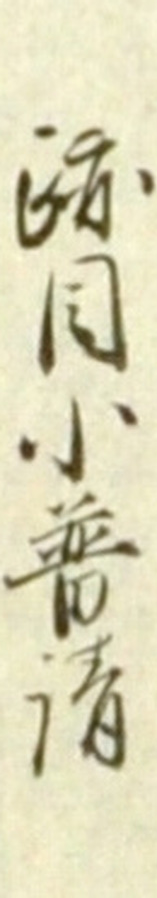跡目小普請
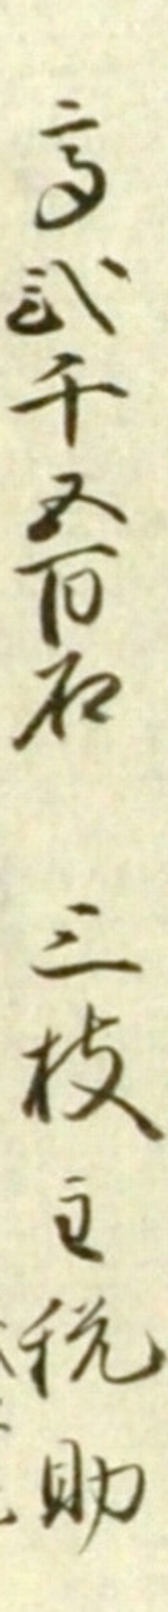高弐千五百石三枝主税助
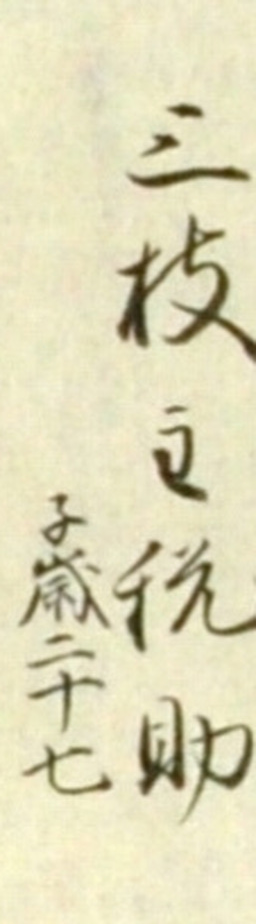子歳二十七
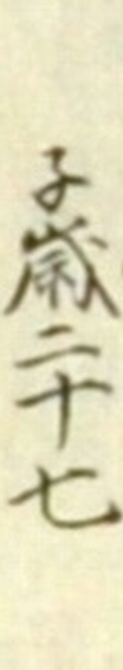子歳二十七
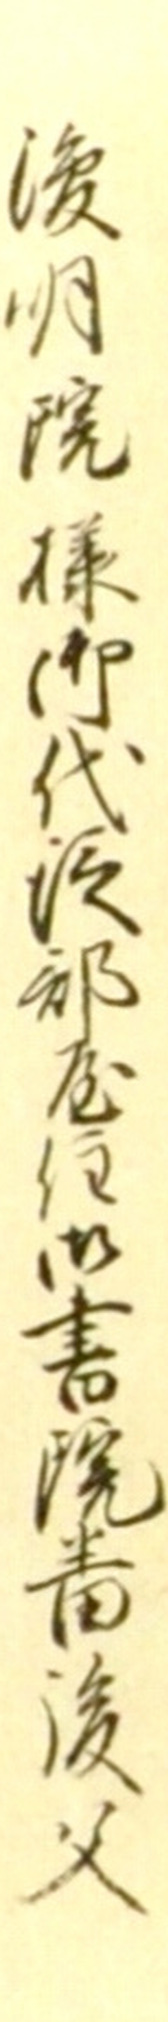浚明院様御代従部屋住御書院番後父
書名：若年寄御役中御調書付
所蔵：伊那市立高遠町図書館・合同会社AMANE
